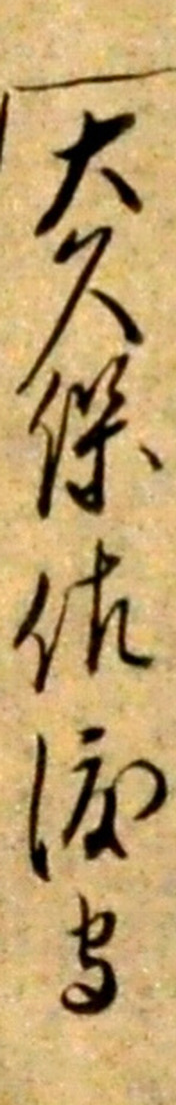大久保佐渡守
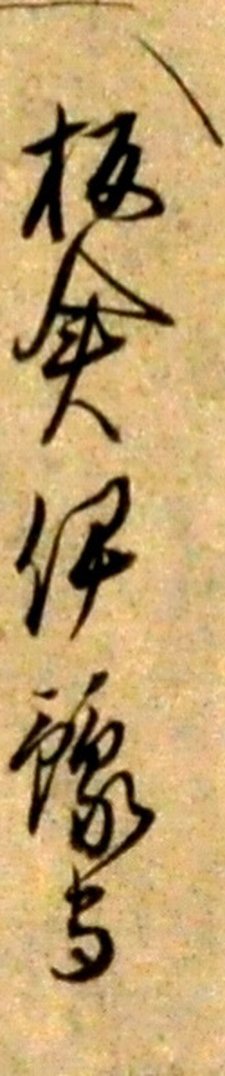板倉伊豫守
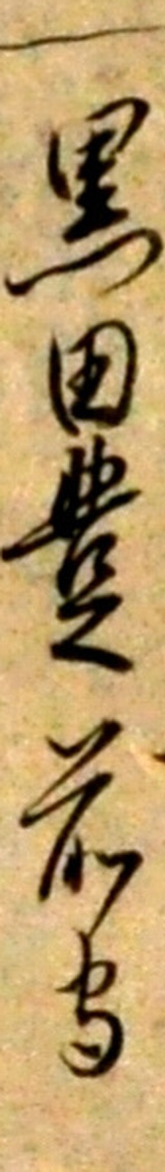黒田豊前守
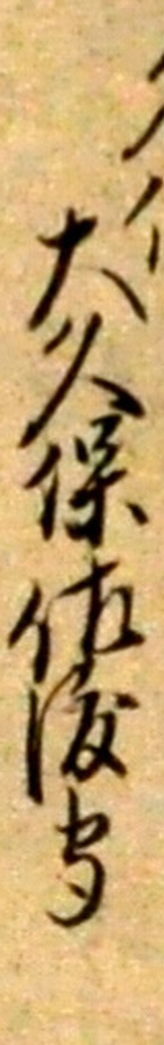大久保佐渡守
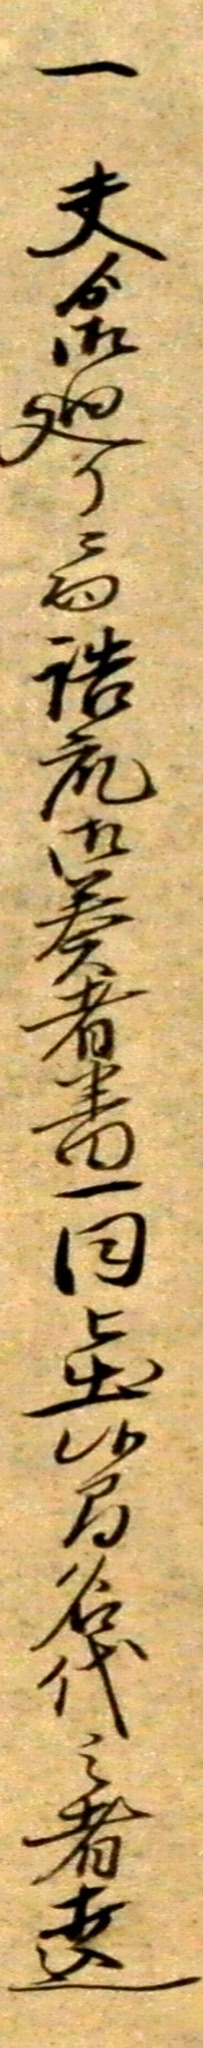一夫ゟ御廻りニ而詰衆御奏者番一同被出候間名代之者打込
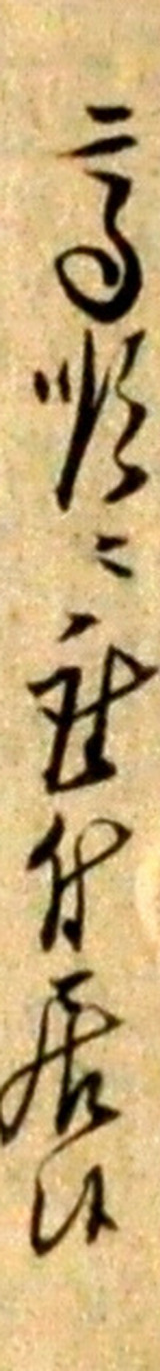高順ニ座付居候
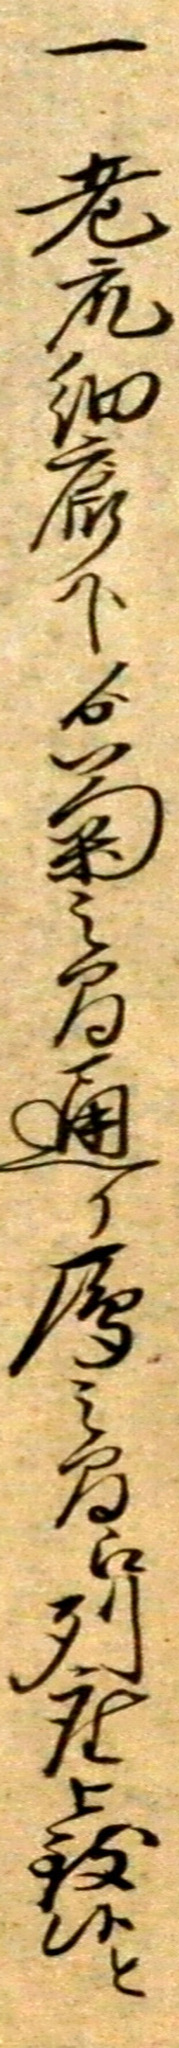一老衆細廊下ゟ菊之間通り鳫之間え列座被致候と
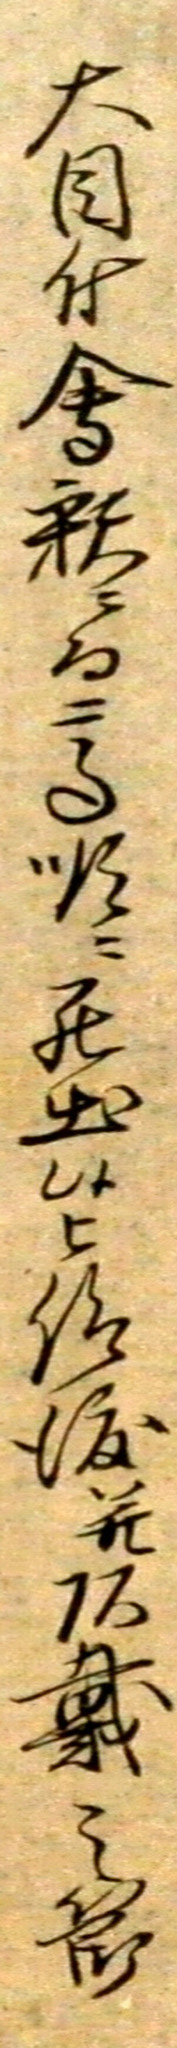大目付会釈ニ而高順ニ罷出候被仰渡并頂戴之節
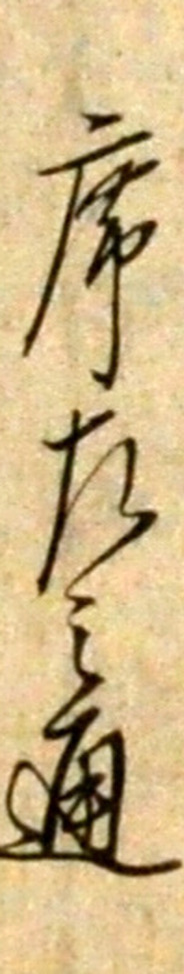席左之通

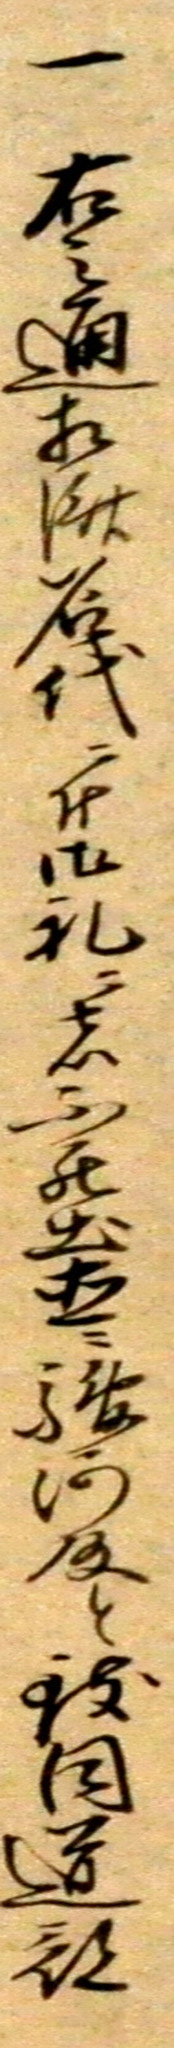一右之通相済名代ニ付御礼ニは不罷出直ニ駿河殿と致同道部
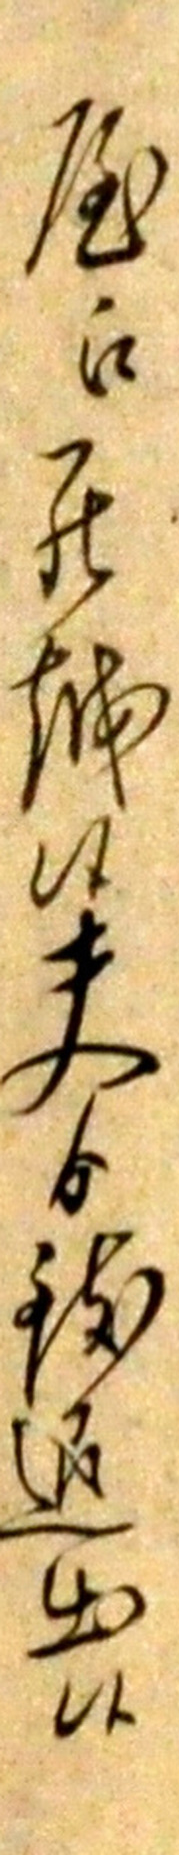屋え罷越候夫ゟ致退出候
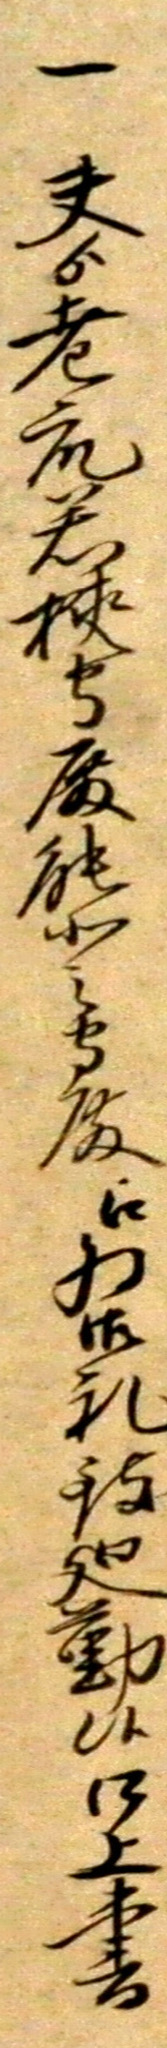一夫ゟ老衆若狭守殿能登守殿え為御礼致廻勤候口上書
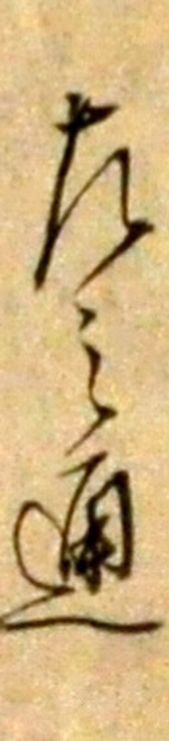左之通
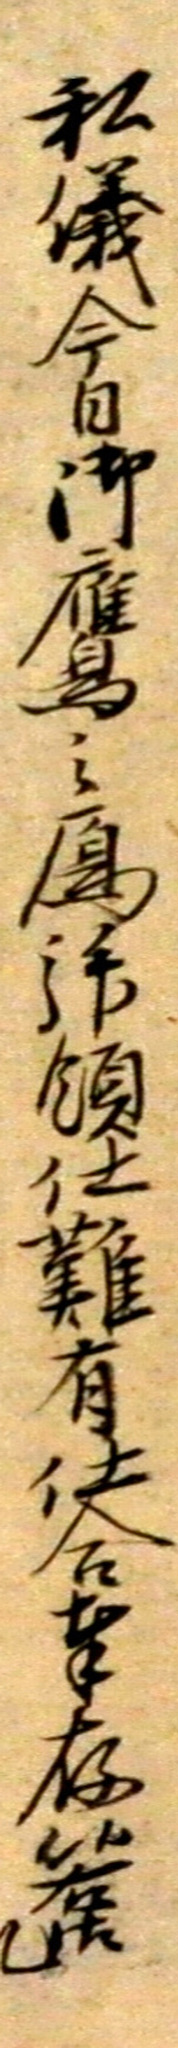私儀今日御鷹之鳫拝領仕難有仕合奉存候右御礼
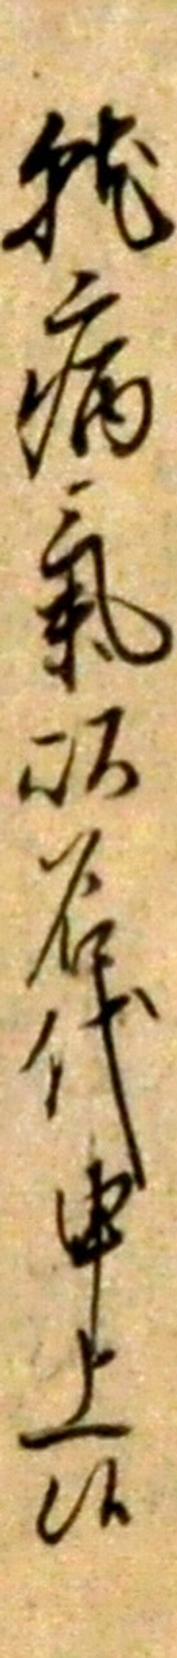就病気以名代申上候
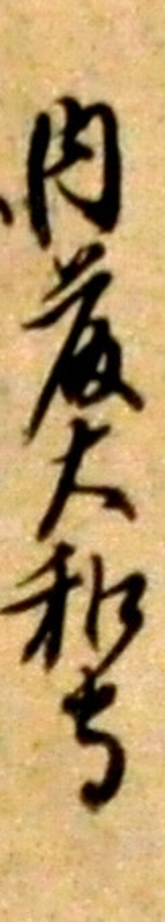内藤大和守
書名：御鷹ノ雁拝領ニ付名代トシテ登城ノ節ノ留
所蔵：伊那市立高遠町図書館・合同会社AMANE
